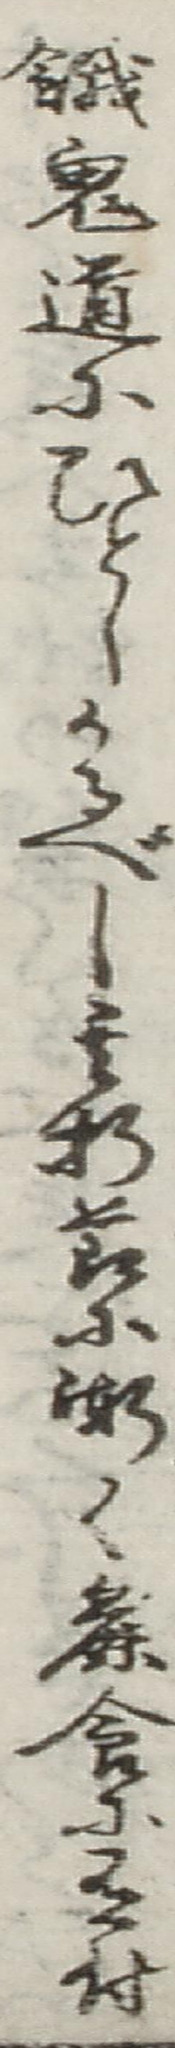餓鬼道にひとしかるべし其折節に漸く麁食に有付
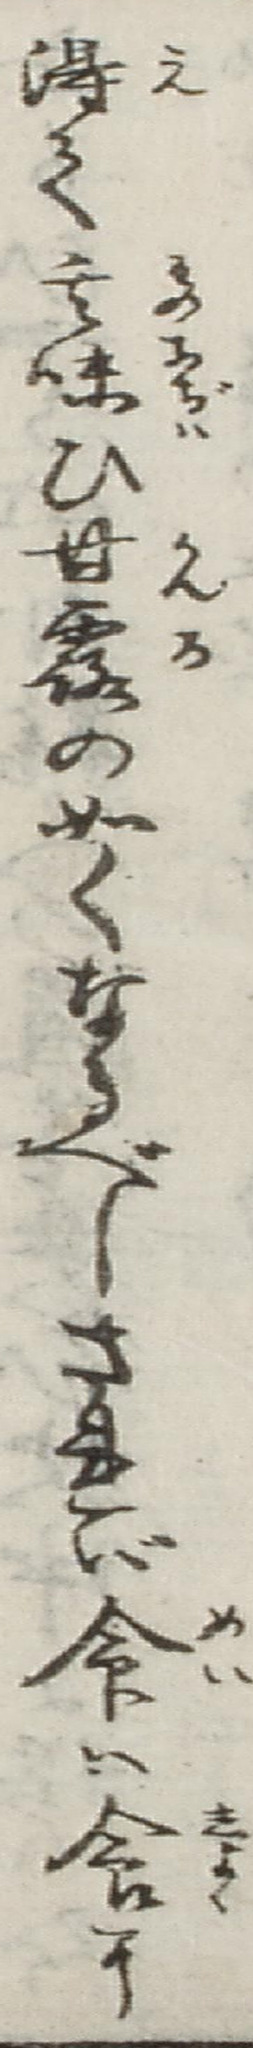得て其味ひ甘露の如くなるべしされバ命ハ食に
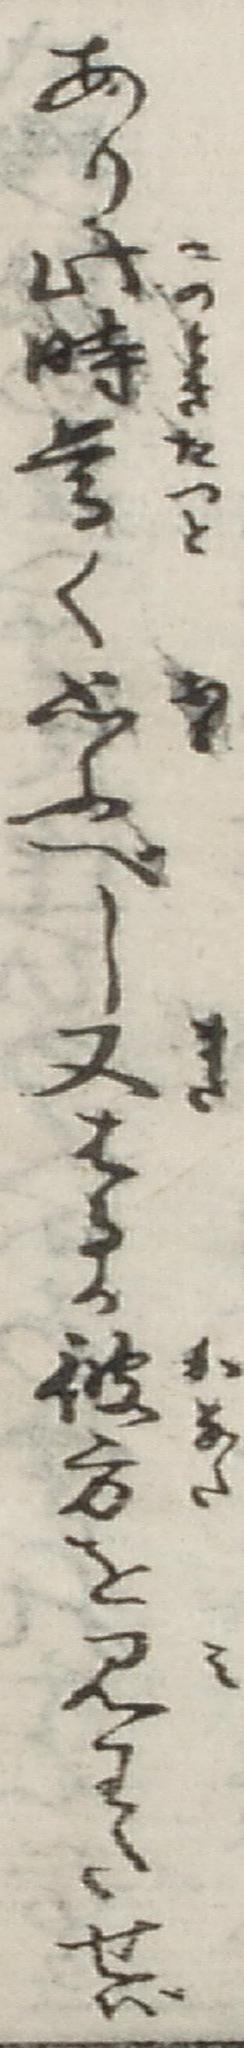あり此時尊く思ふべし又はるか彼方を見わたせバ
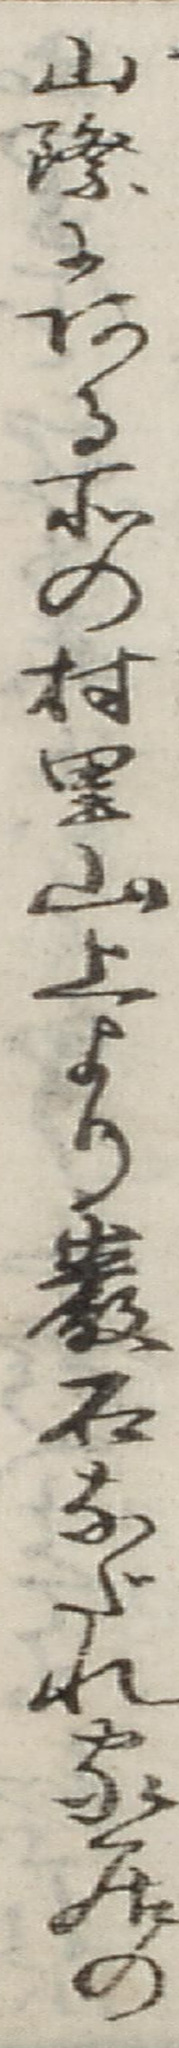山際にある所の村里山上より巌石なだれ家居の
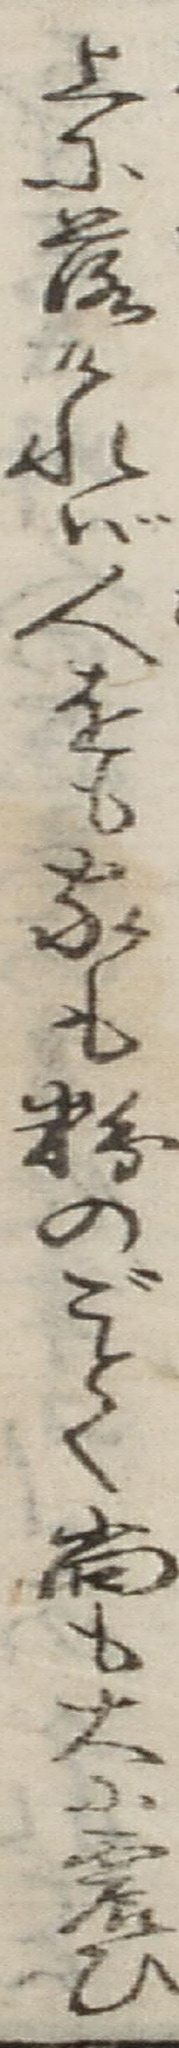上に落けれバ人をも家も粉のごとく尚も大に震ひ
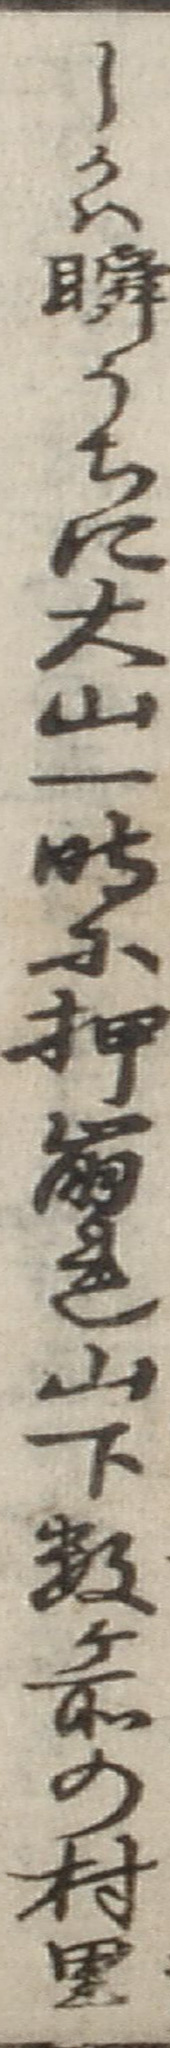しかハ瞬うちに大山一時に押崩れ山下数ヶ所の村里
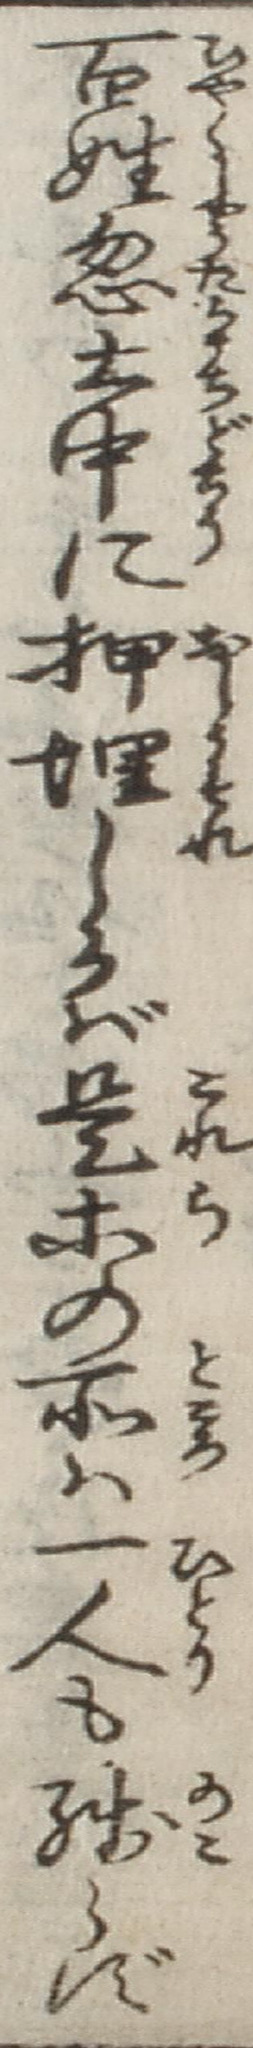百姓忽土中に押埋しかバ是等の所ハ一人も残らず
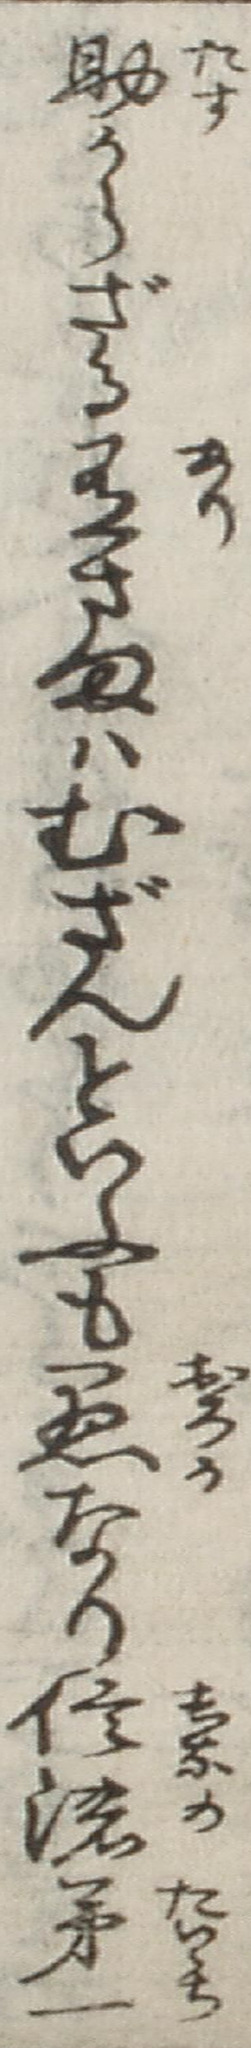助からざる有さまハむざんといふも愚なり信濃第一
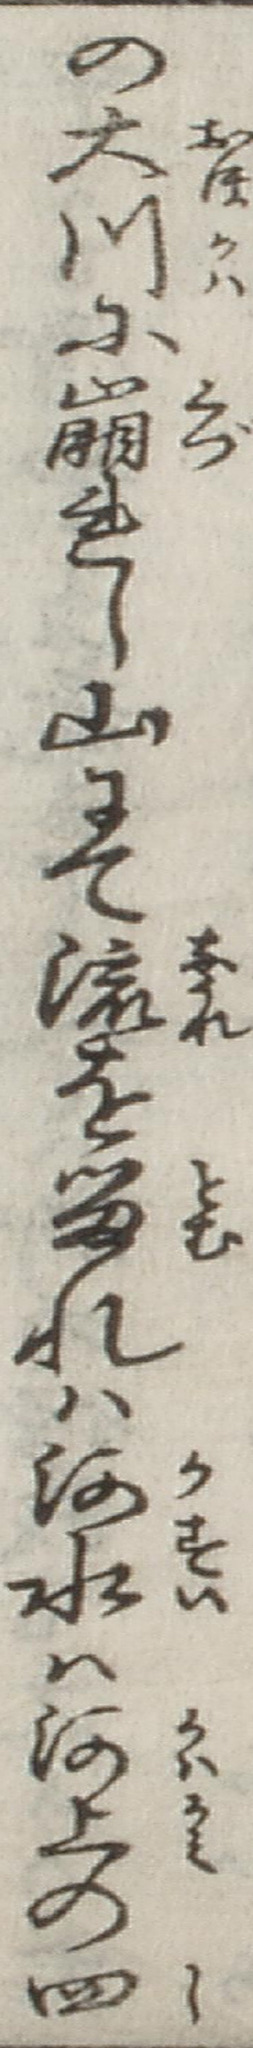の大川に崩れし山にて流を留れハ河水ハ河上の四
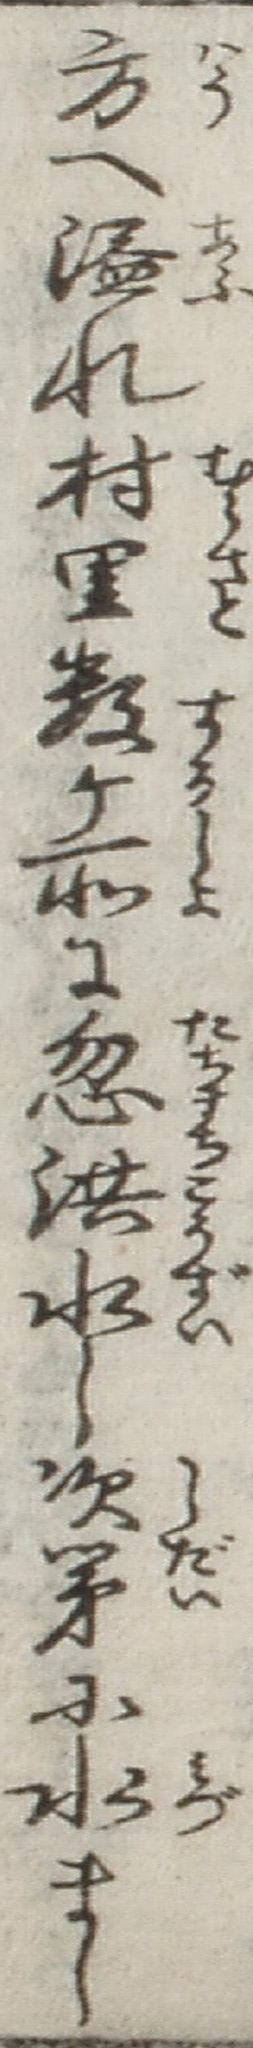方へ溢れ村里数ヶ所に忽洪水し次第に水まし
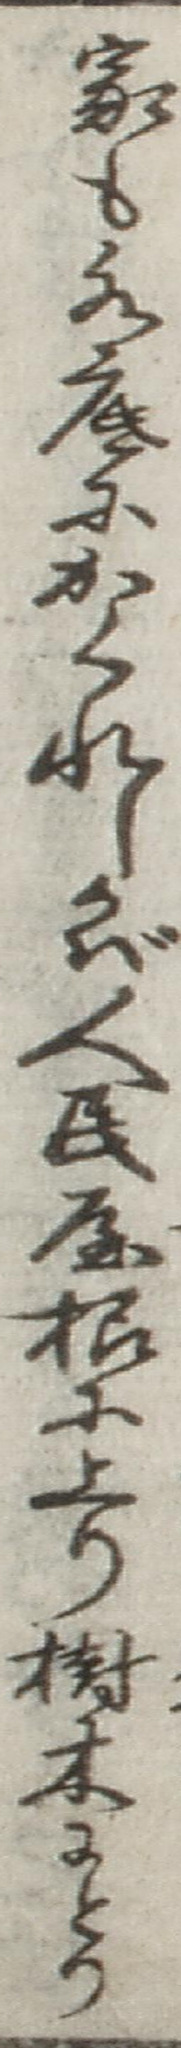家も水底にかくれしかバ人民屋根に上り樹木にとり
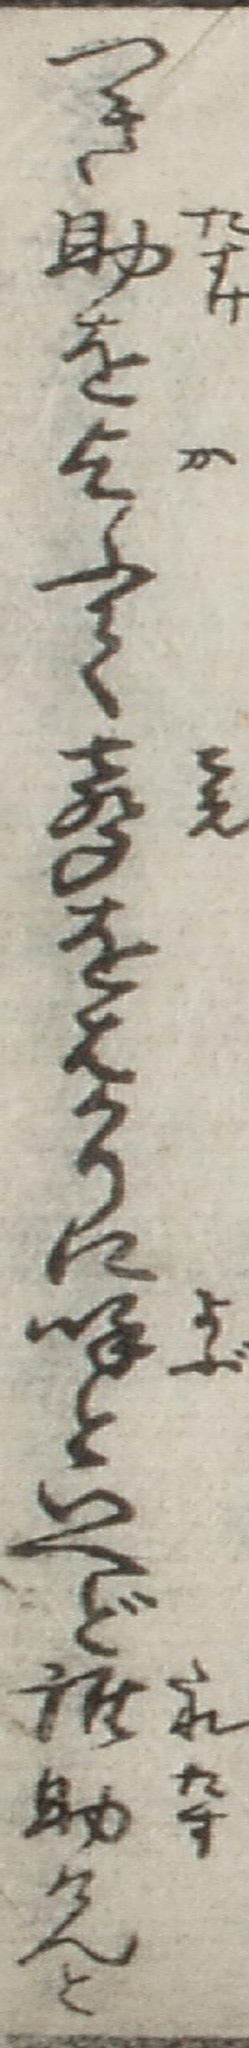つき助を乞ふて聲をはかりに呼といへど誰助けんと

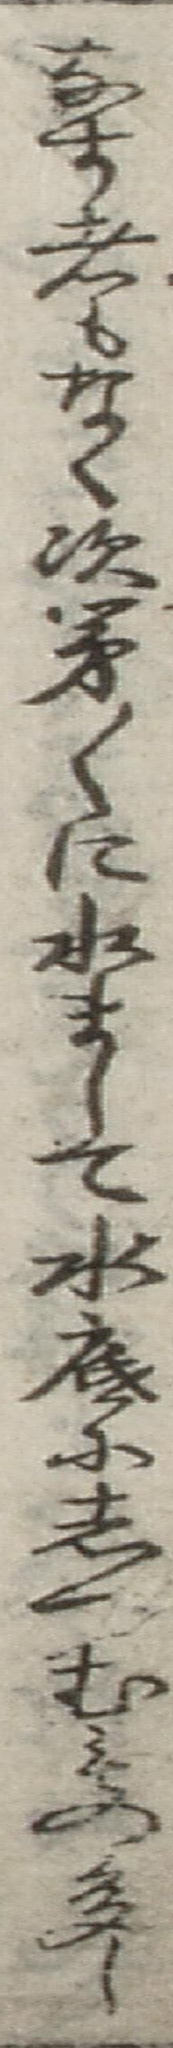なす者もなく次第〳〵に水まして水底にしつむもの多し
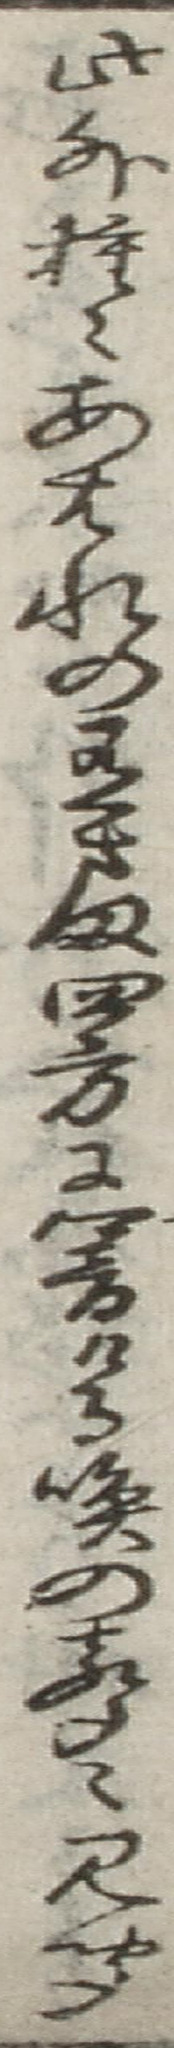此外種あはれの有さま四方に響ける喚の聲〻見聞
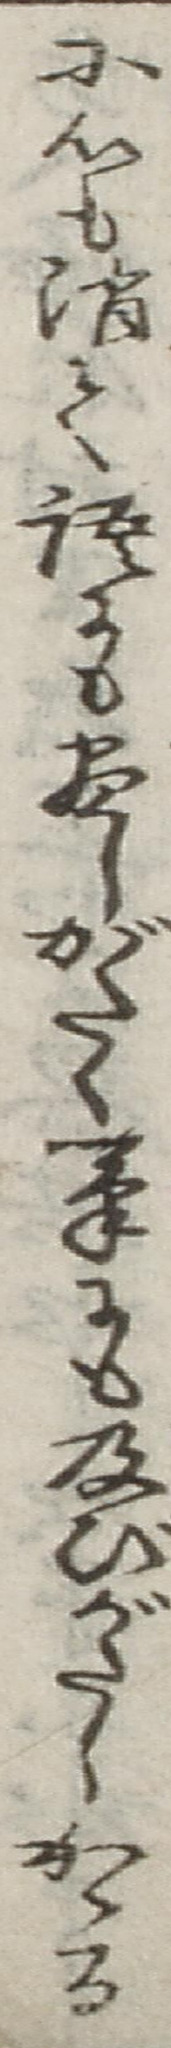に心も消て語にも尽しがたく筆にも及びがたしかゝる
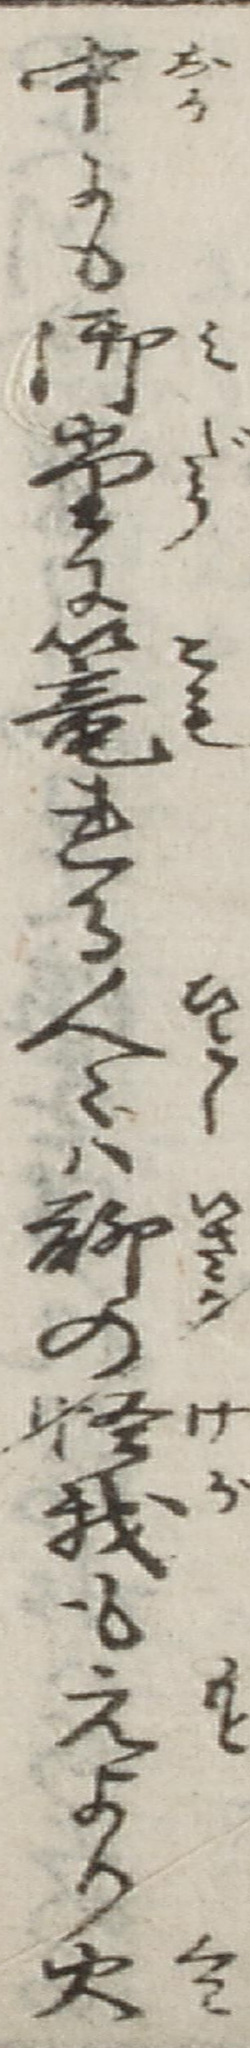中にも御堂に篭れる人〻ハ聊の怪我も元より火
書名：地震世直草紙　全
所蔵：東京大学地震研究所図書室 Earthquake Research Institute Library, The University of Tokyo, JAPAN
